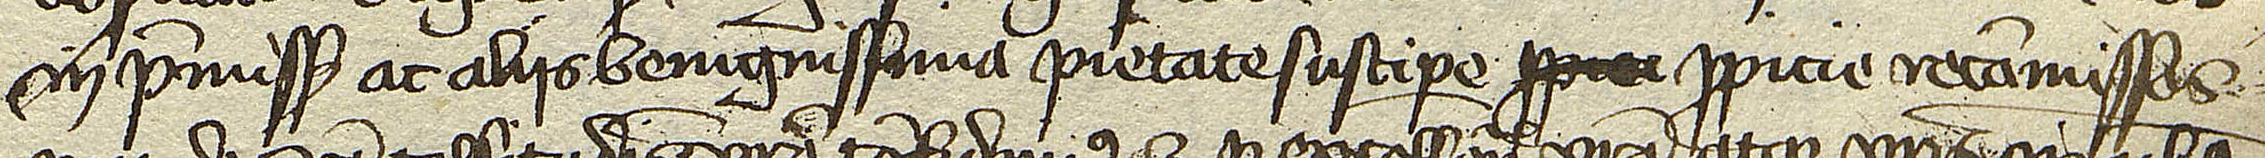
in p*miſſ* ac aliis benigniſſima pietate ſuſcip*e pp%% p*picie rec*a miſſos
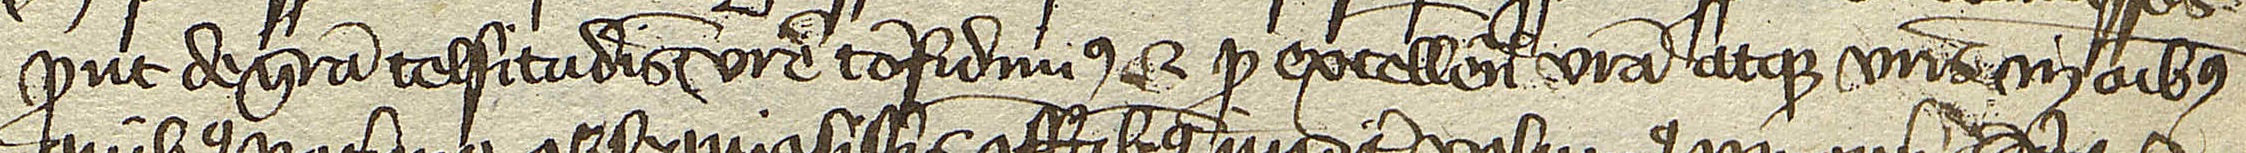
p*ut de gr*a celſitudi*s v*r*e co*fidim* @ p* excellent* v*ra* atq* v*ris in oi*b*
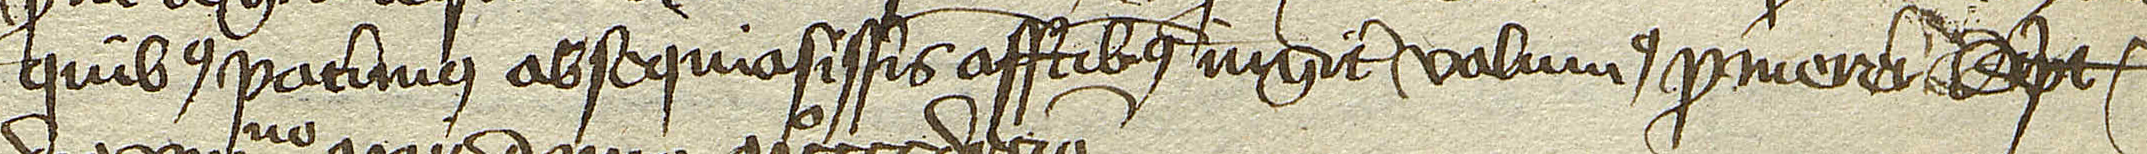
quib* patim* obſequioſiſſ*is aff*ib* iugit* volum* p*me*ri / Scpt*
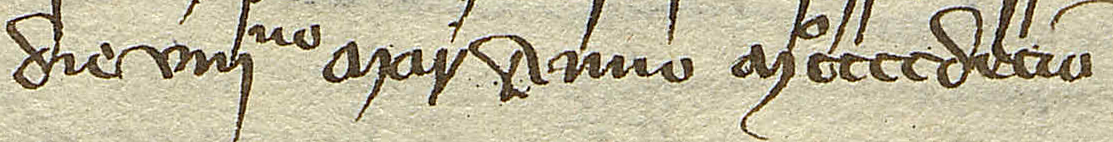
die viii* May Anno M*ccccdeci*o
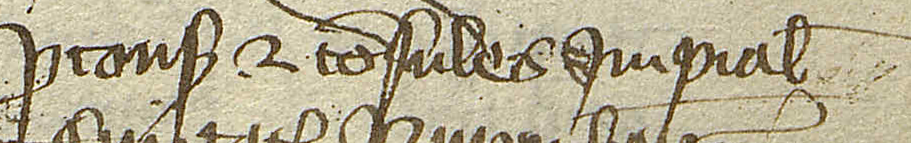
P*conſ* @ co*ſules Imp*ial*
